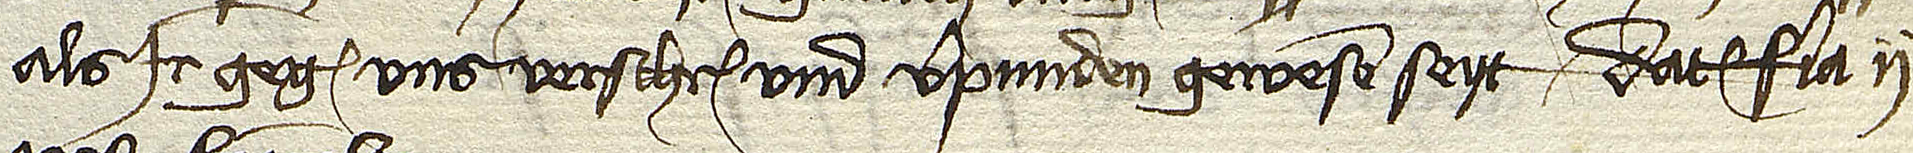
als Ir geg* vns verſchr* vnd v*punden geweſe* ſeyt / Dat* f*ia ii*
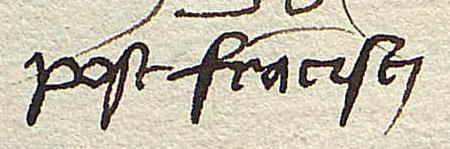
poſt fraciſci*
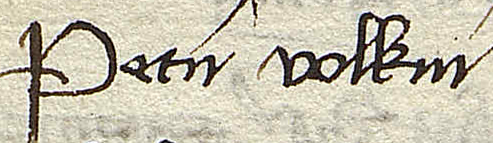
Pet*n volkm*
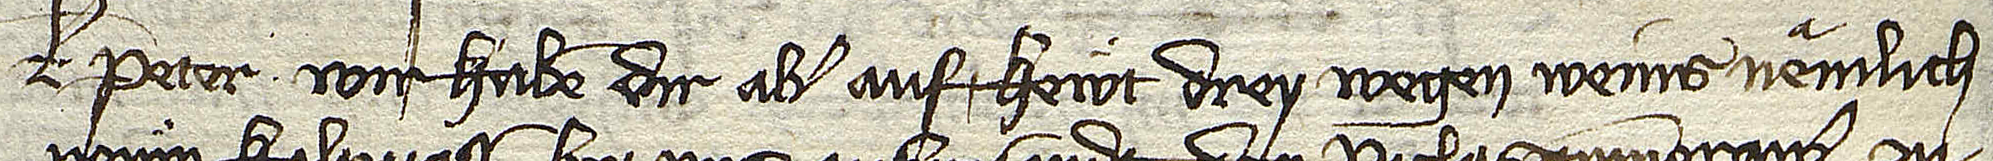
L* Peter . wir habe* dir ab* auf hewt drey wegen weins nëmlich
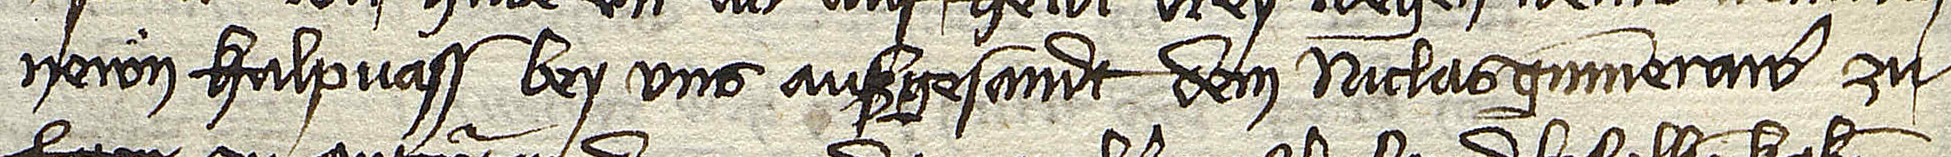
newn halpuaſſ bey vns auſʒgeſandt dem Niclas gum*eraw* ʒu
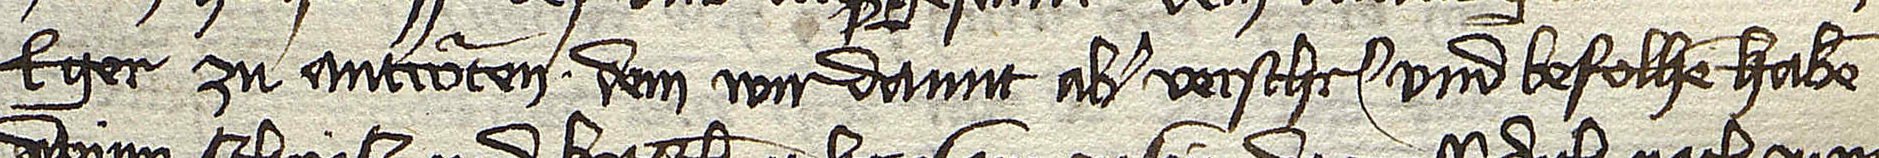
Eger ʒu antw*ten . dem wir damit ab* verſchr* vnd befolhe* habe*
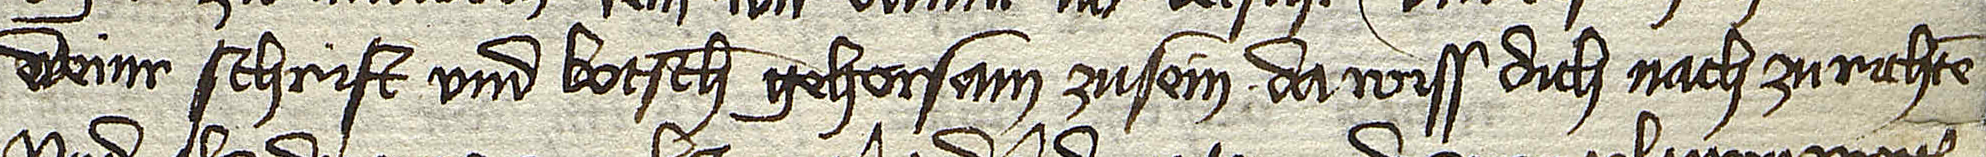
Deinr ſchrift vnd botſch* gehorſam ʒuſein . da wiſſ dich nach ʒu richte*
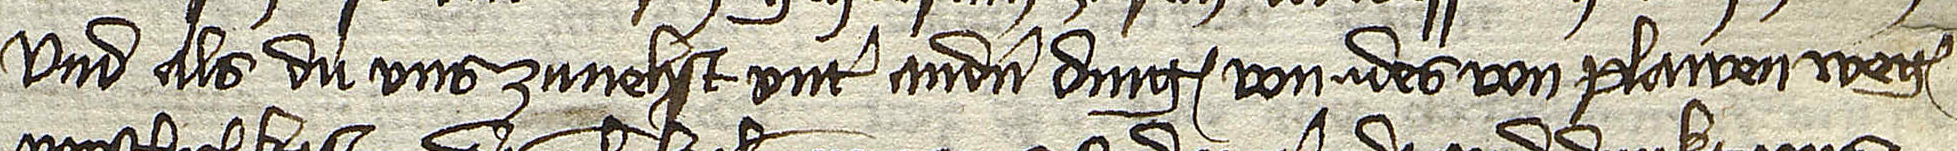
Vnd als du vns ʒunehſt vnt* and*n ding* von ~ des von Plawen weg*
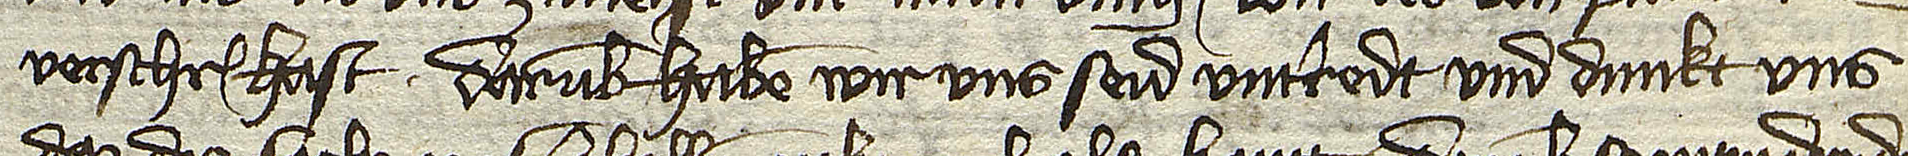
verſchr* haſt . Daru*b habe* wir vns ſeid vnt*redt vnd dunkt vns
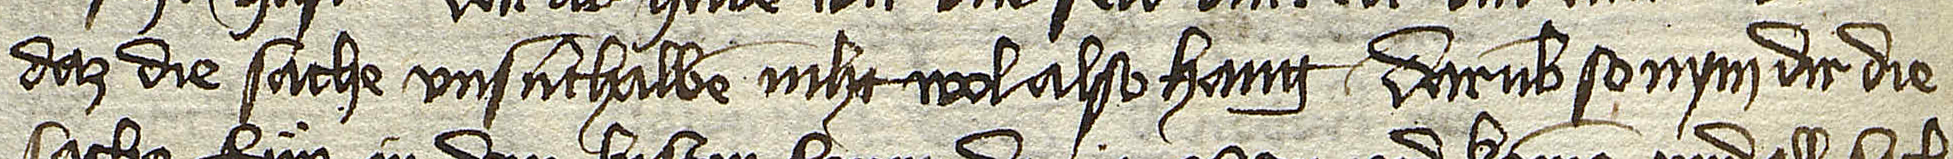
daʒ die ſache vnſn*halbe* niht wol alſo hang / Daru*b ſo nym dir die
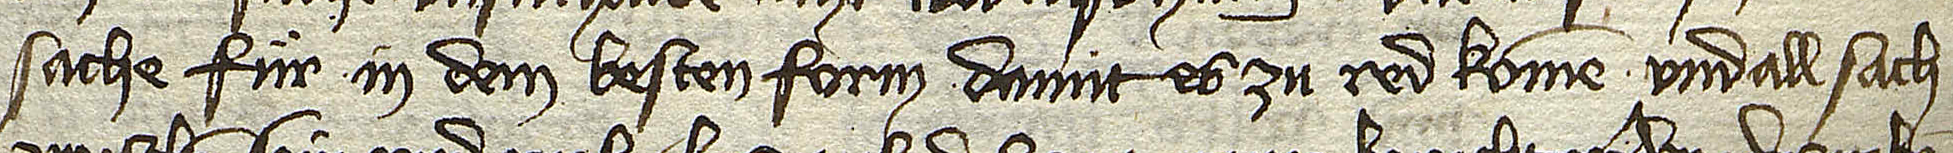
ſache für in dem beſten form damit es ʒu red kome* vnd all ſach
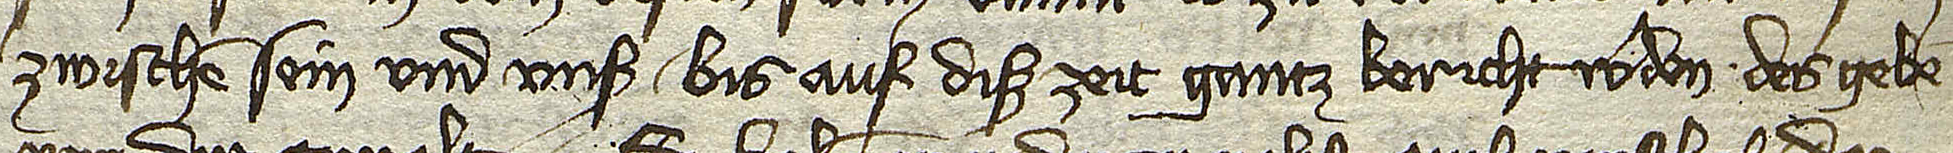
ʒwiſche* ſein vnd vnſ* / bis auf diſʒ ʒeit gancʒ bericht w*den . des gebe*
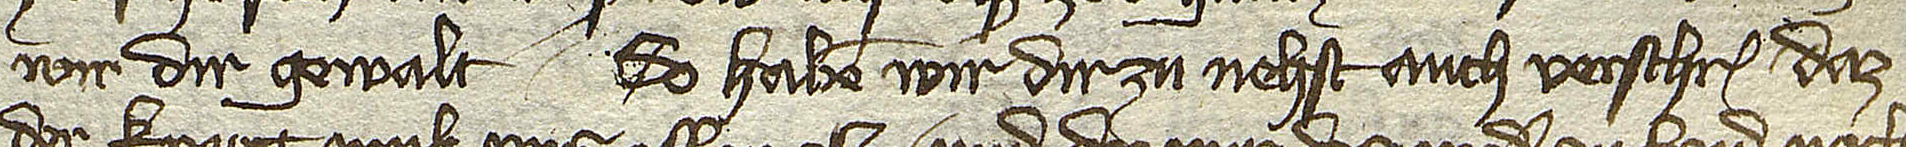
wir dir gewalt / So habe* wir dir ʒu nehſt auch verſchr* / daʒ
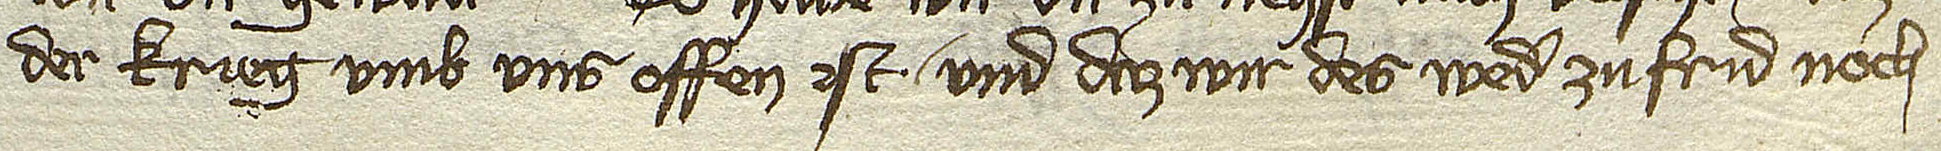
der krieg vmb vns offen iſt / vnd daʒ wir des wed* ʒu frid noch
